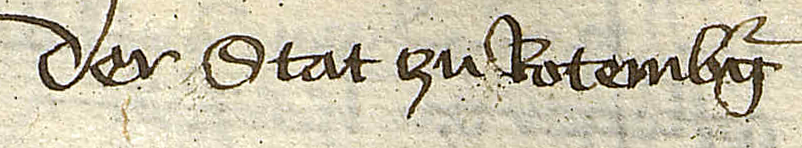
Der Stat cʒu Rotemb*g
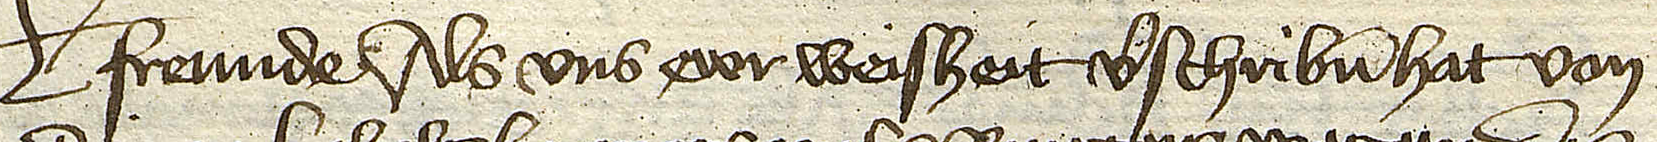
L* freunde . Als vns ewr weiſheit v*ſchrib*n hat von
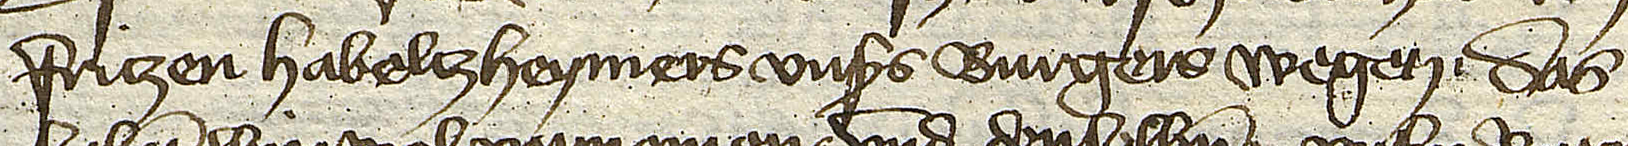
Fricʒen habelcʒheymers vnſ*s Burgers wegen . Das
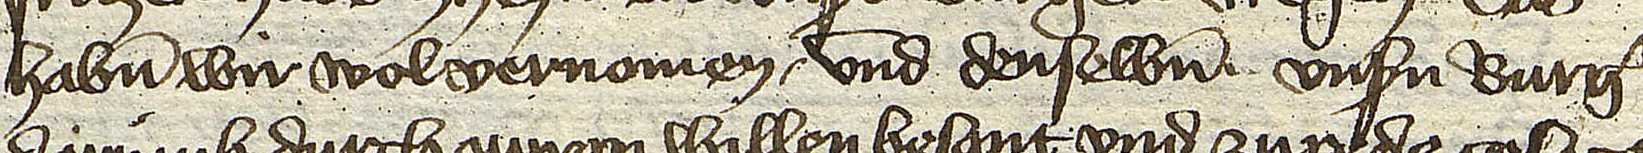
hab*n wir wol vernomen / vnd denſelb*n ~ vnſ*n Burg*
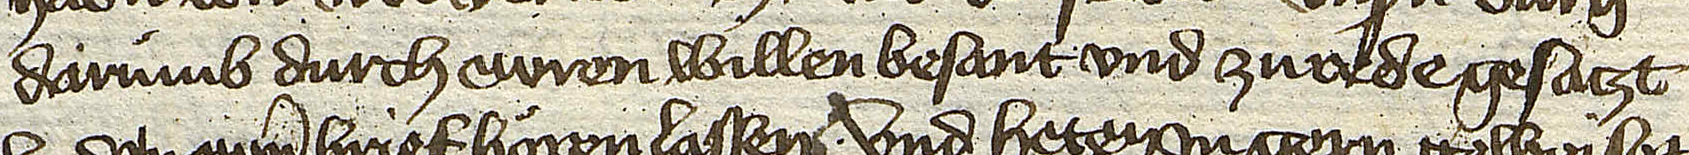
darümb durch ewren willen beſant vnd cʒu rede geſacʒt
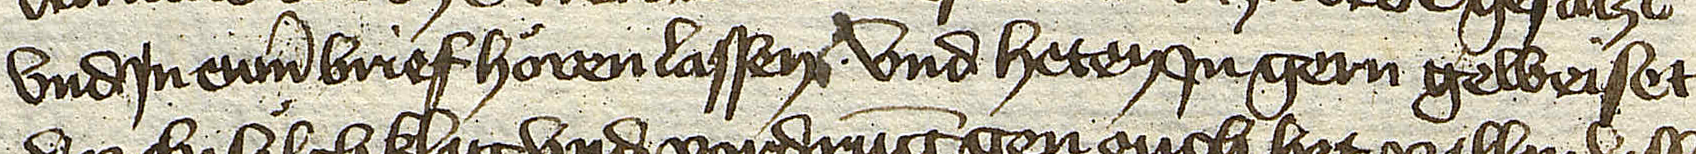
vnd In ewn* brief hören laſſen . Vnd heten In gern geweiſet
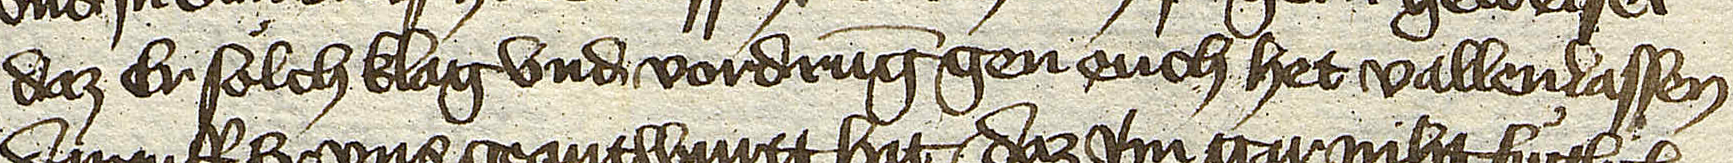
daʒ Er ſölch klag vnd vordru*g gen euch het vallen laſſen
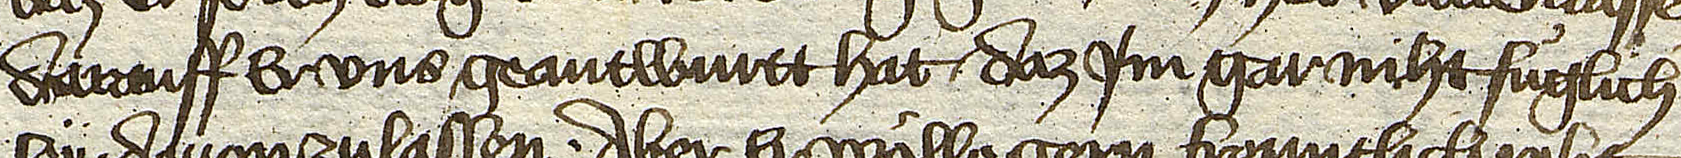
darauff Er vns geantwurt hat / daʒ Im gar niht füglich
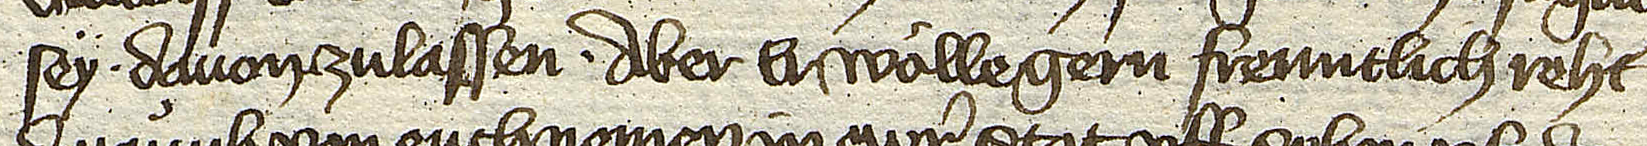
ſey . dauon cʒulaſſen . Aber Er wölle gern freuntlich reht
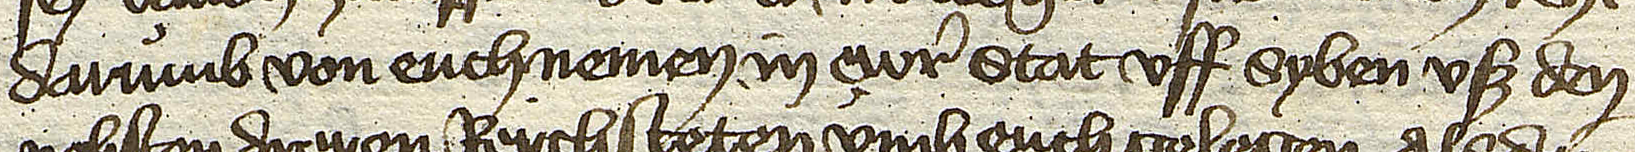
darümb von euch nemen in ewr* Stat vff Syben vſʒ den
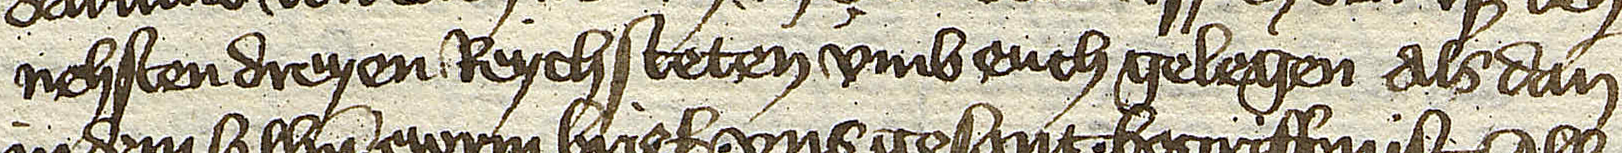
nehſten dreyen Reychſteten v̈mb euch gelegen Als dan*
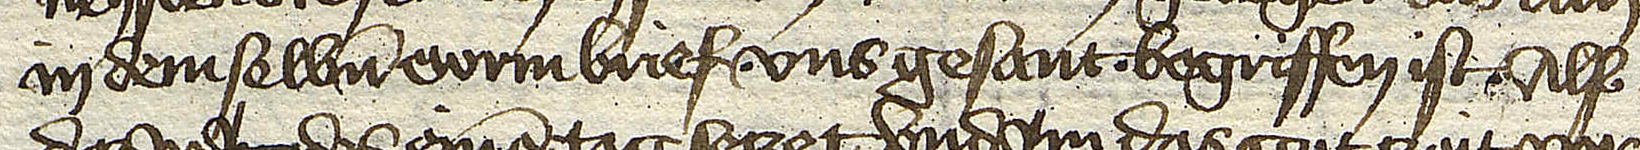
in demſelb*n ewrm brief . vns geſant . begriffen iſt . Alſo
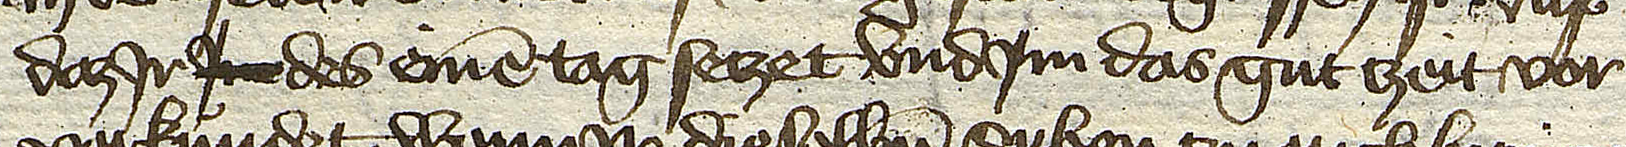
daʒ Ir Im des eine* tag ſecʒet vnd Im das gut cʒeit vor
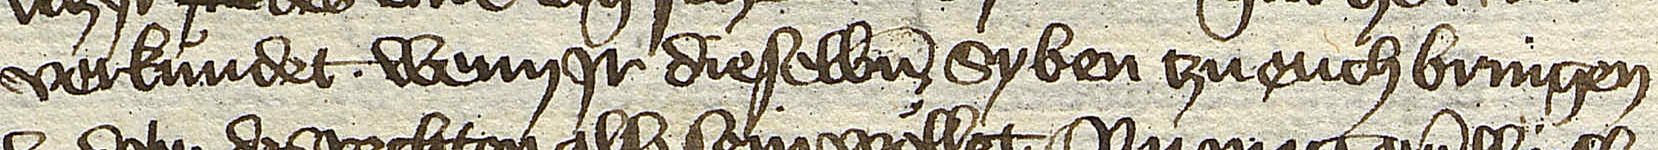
verkündet . wenn Ir dieſelb*n Syben cʒu euch bringen
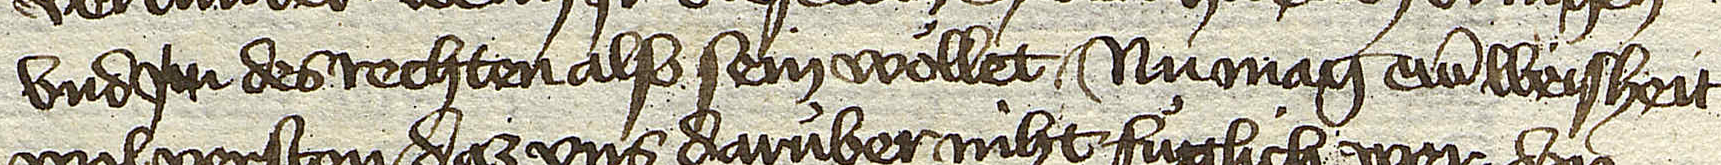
vnd Im des rechten alſo ſein wöllet / Nu mag ew* weiſheit
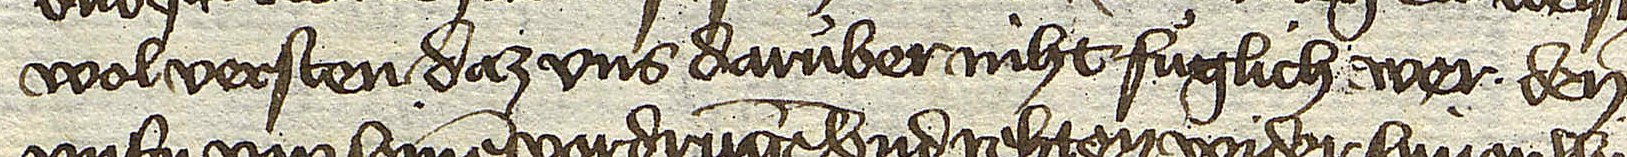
wol verſten / daʒ vns darüber niht füglich wer . den
